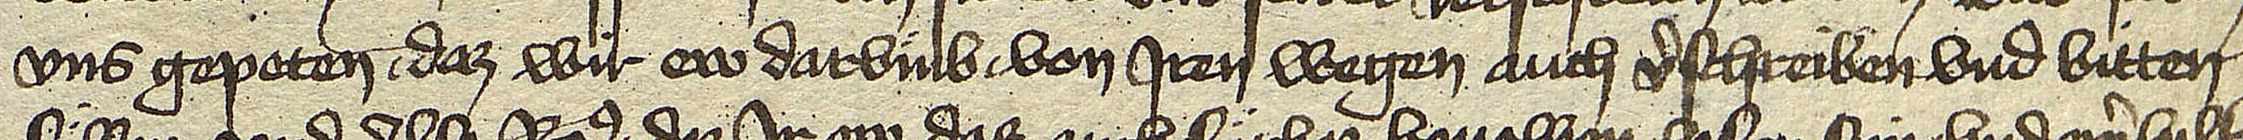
vns gepeten / daʒ wir ew darümb / von Iren wegen auch v*ſchreiben vnd bitten
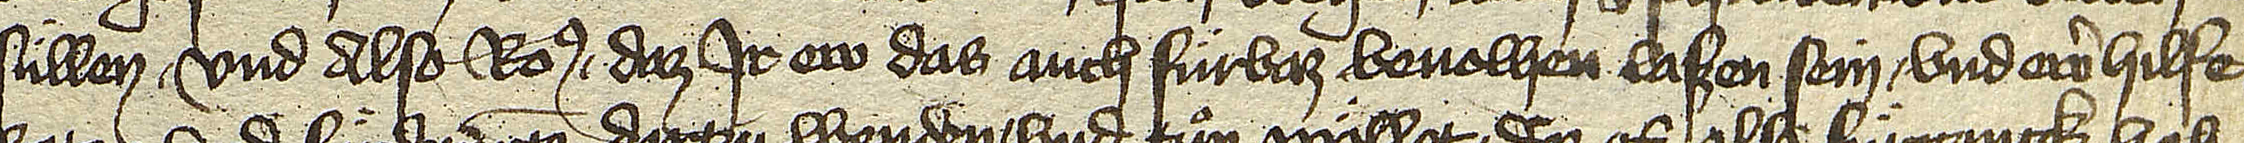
ſüllen / vnd Alſo Ro* / daʒ Ir ew das auch fürbaʒ beuolhen laſʒen ſein / vnd ew* hilfe /
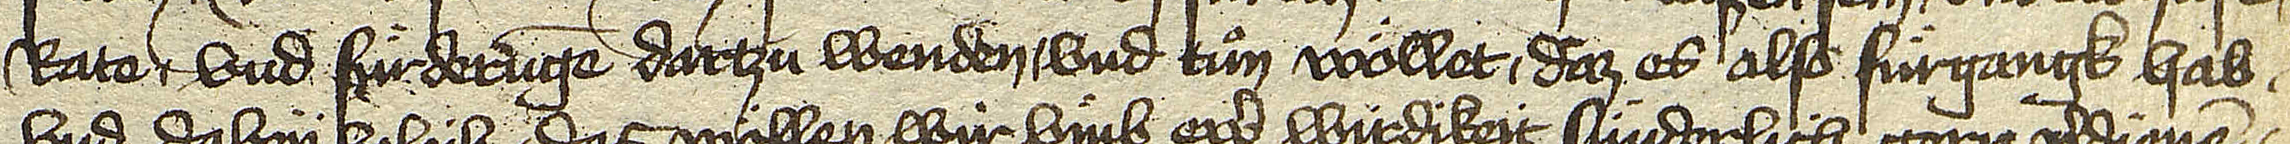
Rate / vnd fürderuge* darcʒu wenden / vnd tün wöllet / daʒ es alſo fürgangk hab /
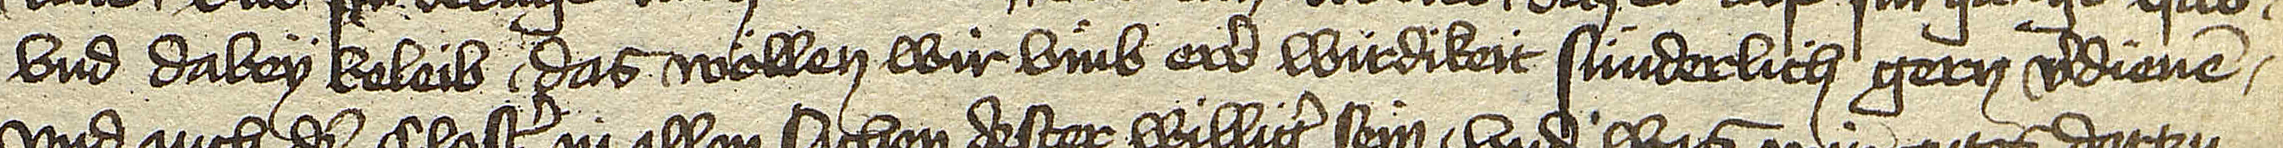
vnd dabey beleib / das wöllen wir ümb ew* wirdikeit ſünderlich gern v*diene* /
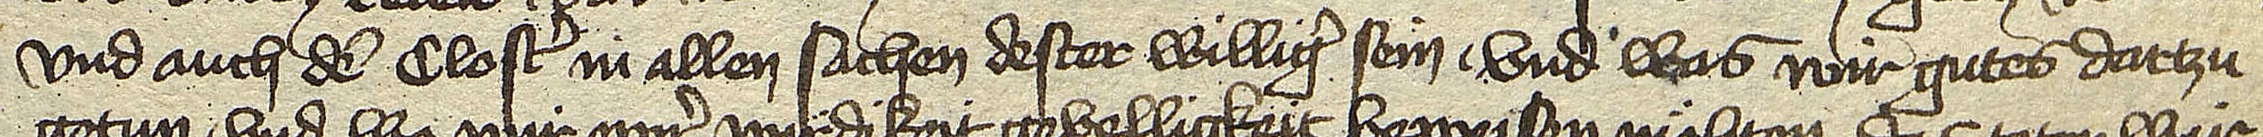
vnd auch de* Cloſt* in allen ſachen deſter willig* ſein / vnd was wir gutes dartʒu
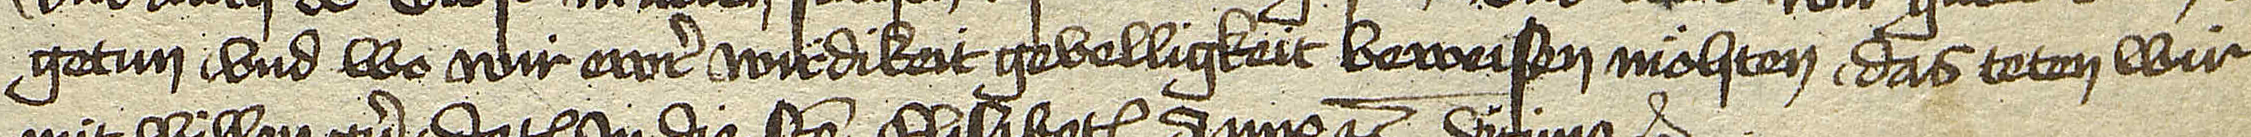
getun / vnd wo wir ewr* wirdikeit gevelligkeit beweiſen möhten / das teten wir
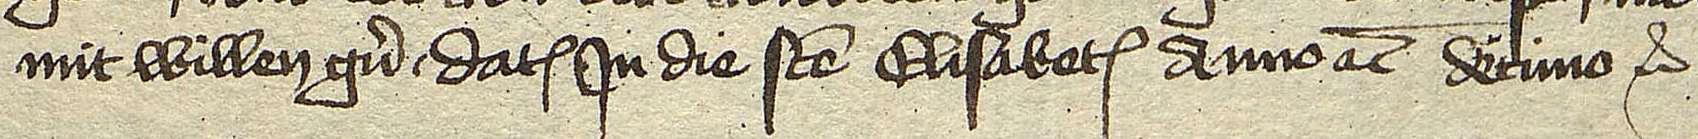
mit willen gn* / dat* In die ſce* Eliſabet* Anno ec* decimo §
